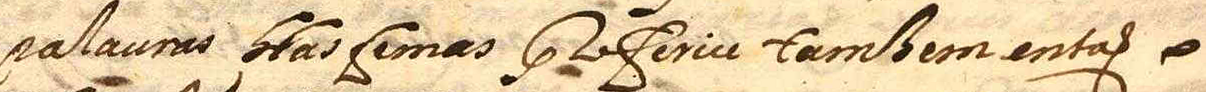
palauras blasfemas proferiu tambem entaõ o
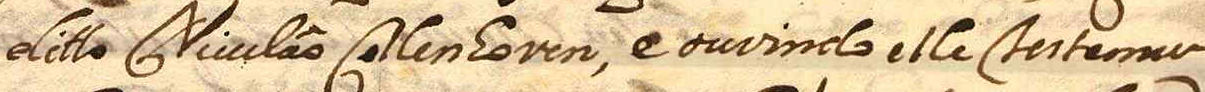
ditto Niculâo Collenhoven, e ouvindo elle testemu
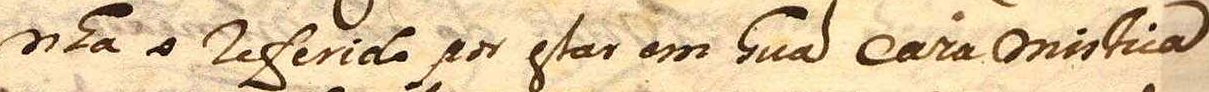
nha o Referido por estar em huā caza mistica
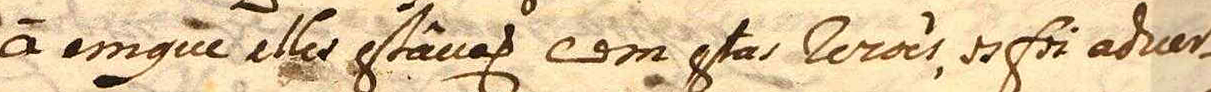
á em que elles estâuaõ com estas Rezoēs, os foi aduer
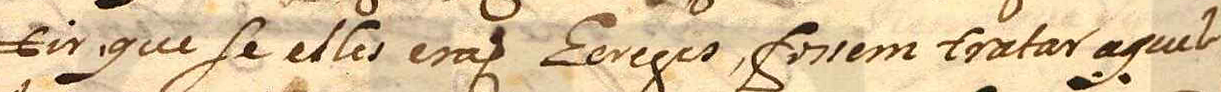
tir que se elles eraõ hereges, fossem tratar aquel
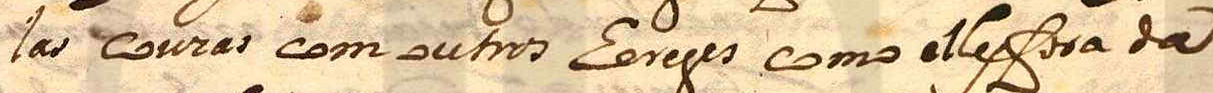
las couzas com outros hereges como elles fora da
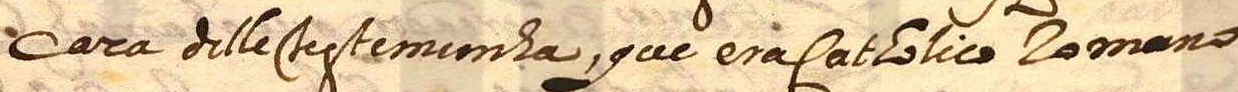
caza delle testemunha, que era Catholico Romano
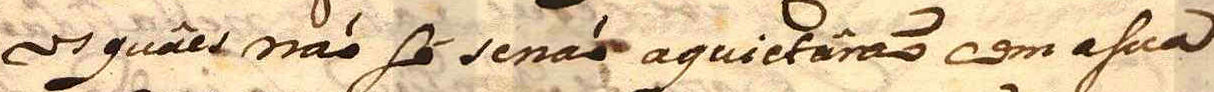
os quâes naõ só se naõ aquietârão com a sua
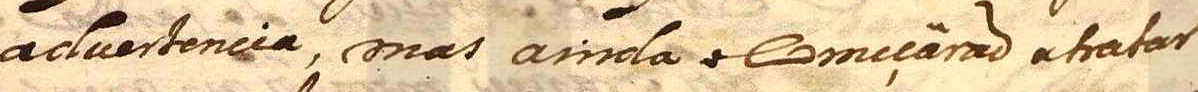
aduertencia, mas ainda o começâraõ a tratar
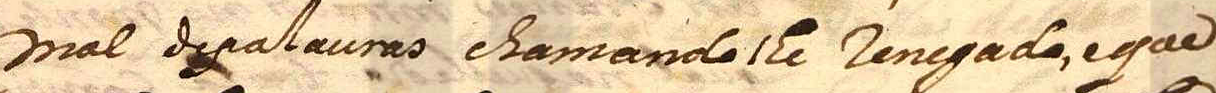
mal de palauras chamandolhe Renegado, e que
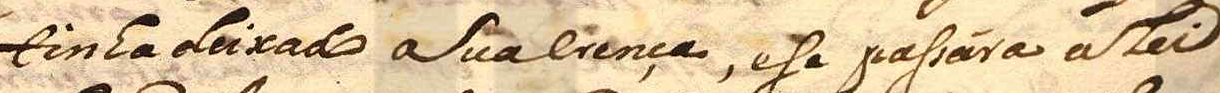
tinha deixado a sua crença, e se passára a Lei
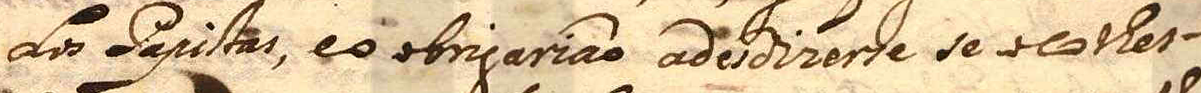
dos Papistas, e o obrigarião a desdizerse se o colhes
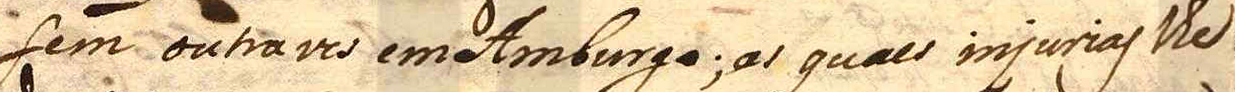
sem outra ves em Amburgo; as quaes injurias lhe
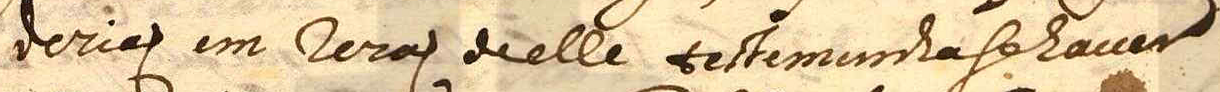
dezião em Rezaõ de elle testemunha se hauer
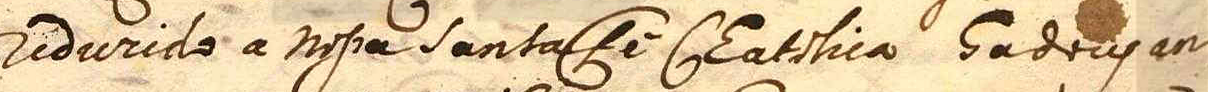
reduzido a nossa santa Fé Chatolica ha dous an
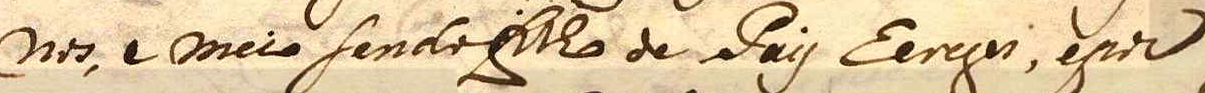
nos, e meio sendo filho de Pais hereges, e por
